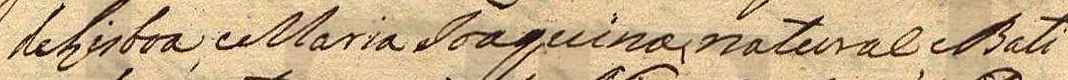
de Lisboa, e Maria Ioaquina natural e Bati
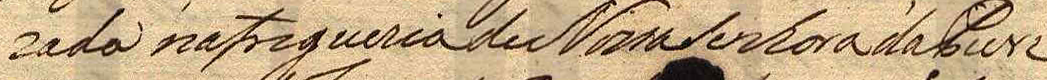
zada na freguezia de Nossa Senhora da Puri
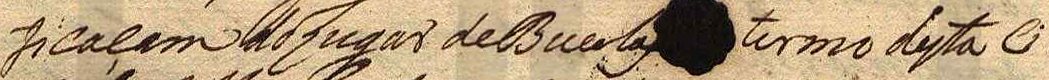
ficaçam do Lugar de Buelas termo desta ci
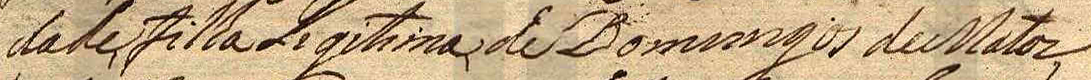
dade, filha Legitima, de Domingos de Matoz
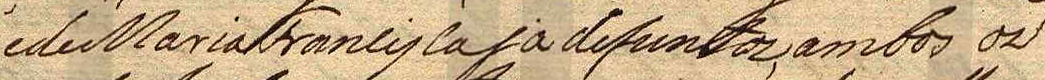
e de Maria Francisca ja defuntoz, ambos oz
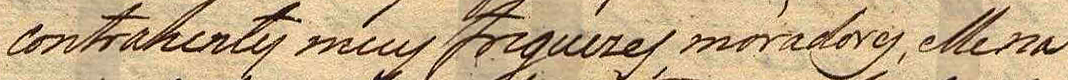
contrahentes meus freguezes, moradores, elle na
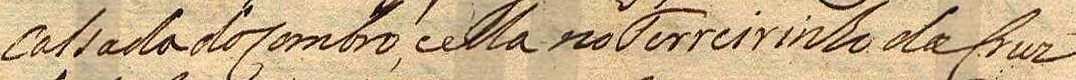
calsada do Combro, e ella no Terreirinho da Cruz
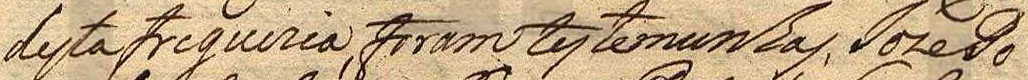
desta freguezia, foram testemunhas, Ioze Go
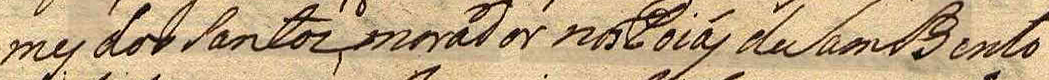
mes dos santos, morador nos Goiás de Sam Bento
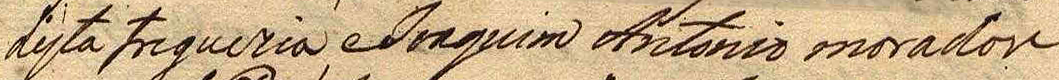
desta freguezia, e Ioaquim Antonio morador
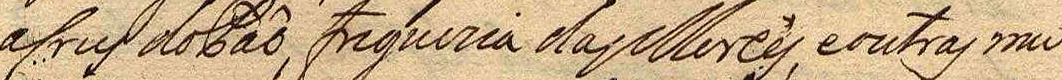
a Crus do Paõ, freguezia das Merces, e outras mu
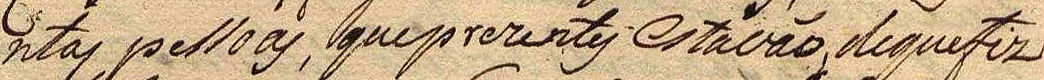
ntas pessoas, que prezentes estavão, de que fiz
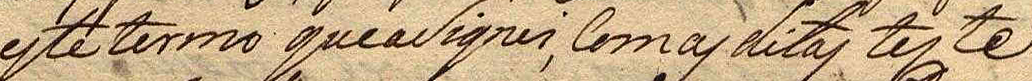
este termo que asignei, com as ditas teste
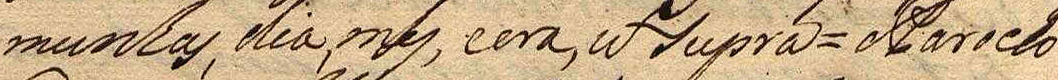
munhas, dia, mes, e era, ut supra= o Parocho
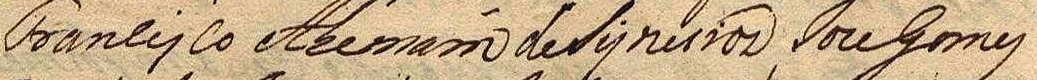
Francisco Abemam, de Sisneiroz, Ioze Gomes
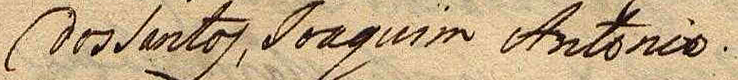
dos santos, Ioaquim Antonio.
